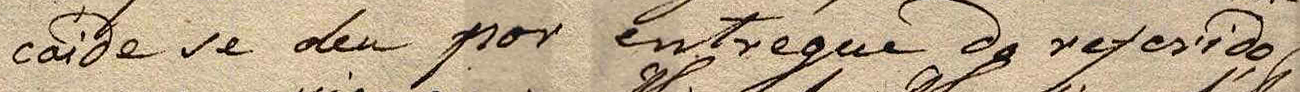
caide se deu por entregue do referido
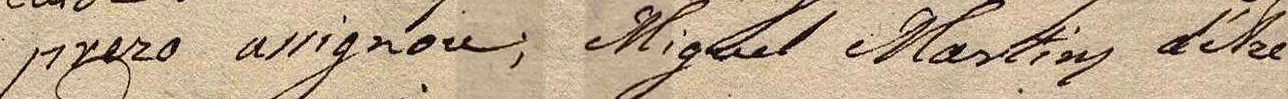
prezo assignou; Miguel Martins d'Aze
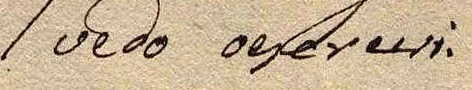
vedo o escrevi.
